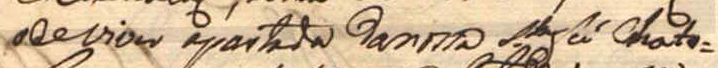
o de viver apartada da nossa s.ta feé Chato
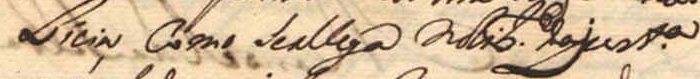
Licia, Como se allega no lib.o da just.a
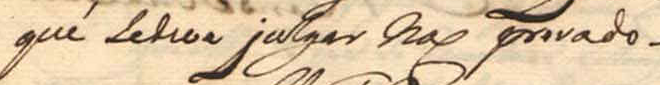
que se deve julgar naõ provado
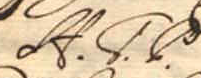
H. T. P.
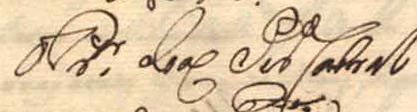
o D.or Ioaõ Pera Cabral
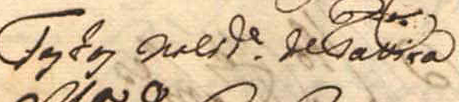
Testos na cid.e de Tavira
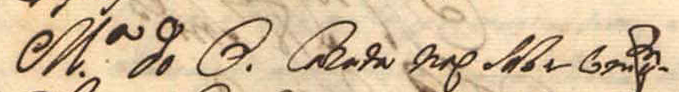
M.a do O. Cazada naõ sabe com q.m
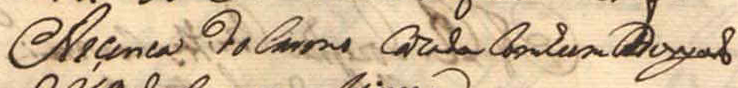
Vicença do Carmo Cazada Com hum Aderyal
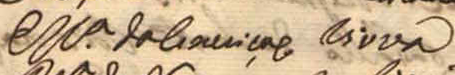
E M.a da Conceiçaõ viuva
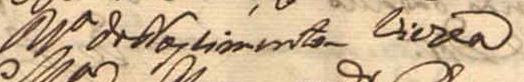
Ma do Nascimento- Viuva
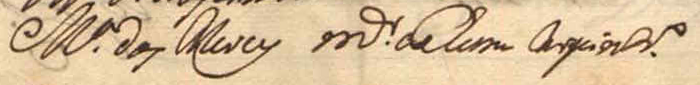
M.a das Merces m.er de hum Carpintr.o
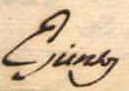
E juntos
